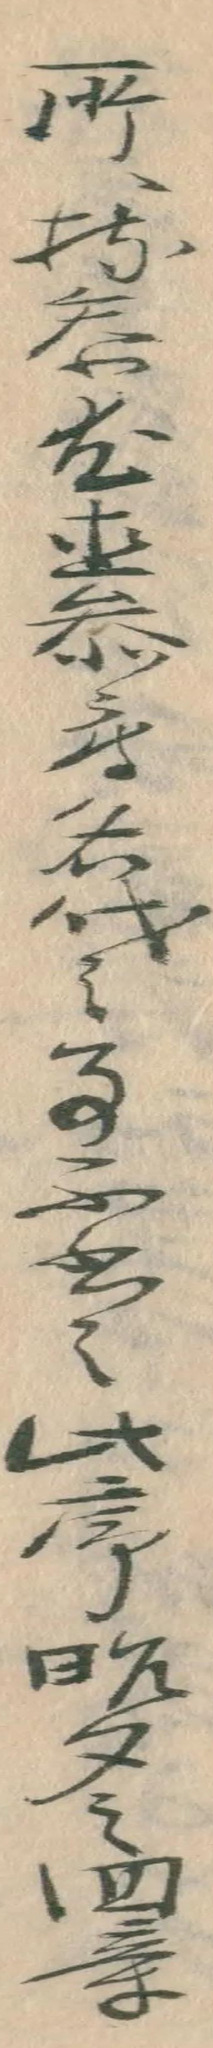所へ持参尤直参ニ付名代之事不書之此序昨夕之回章
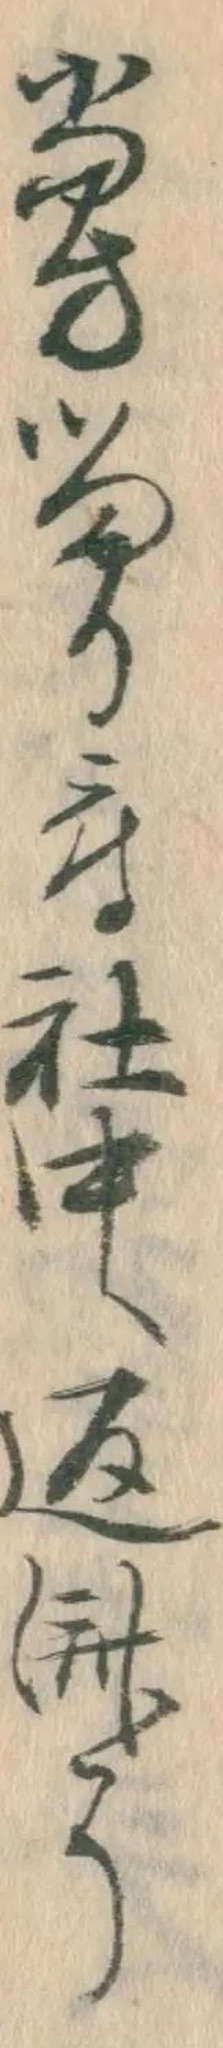當方留リニ付社中返済了
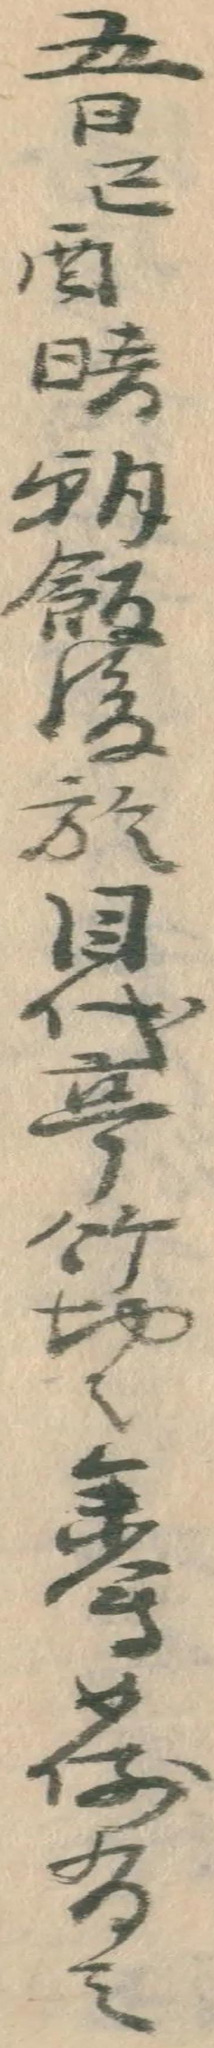五日己酉晴朝飯後於目代亭竹切之参會如例有之
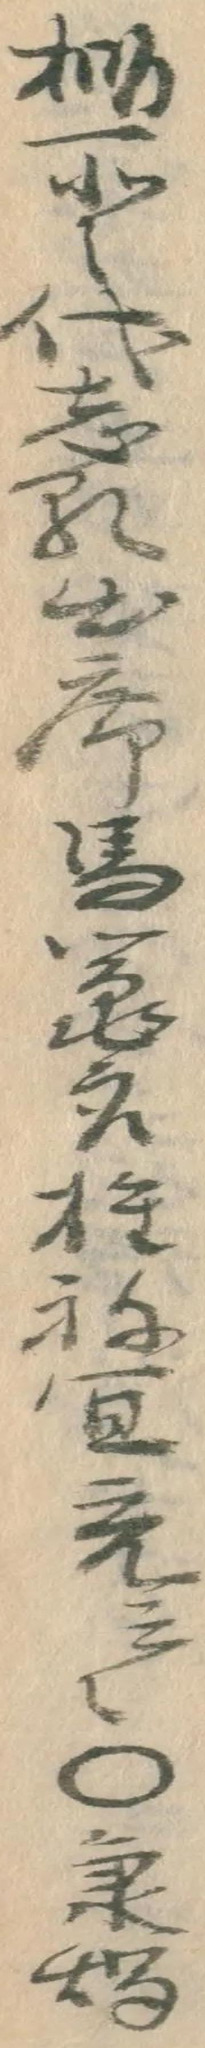棚所之代志類出席馬鬮取権称宜充云〻○秉燭

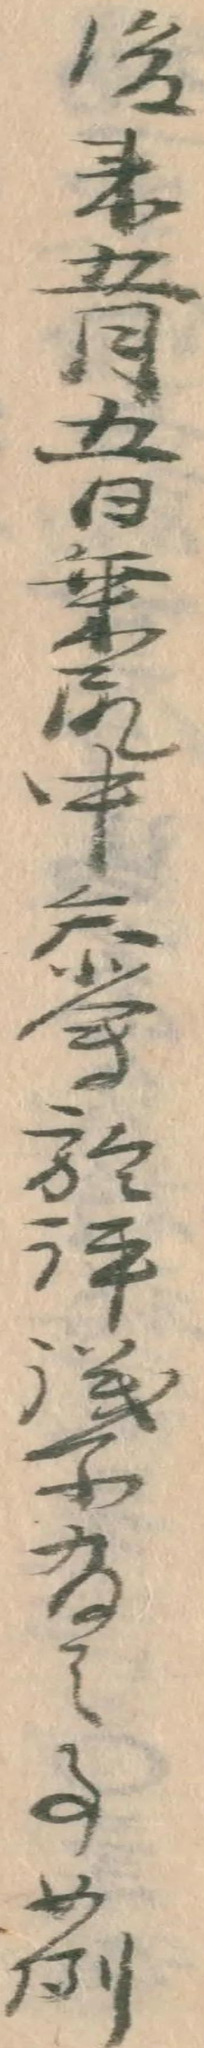後来五月五日乗尻中参會於評議不有之事如例
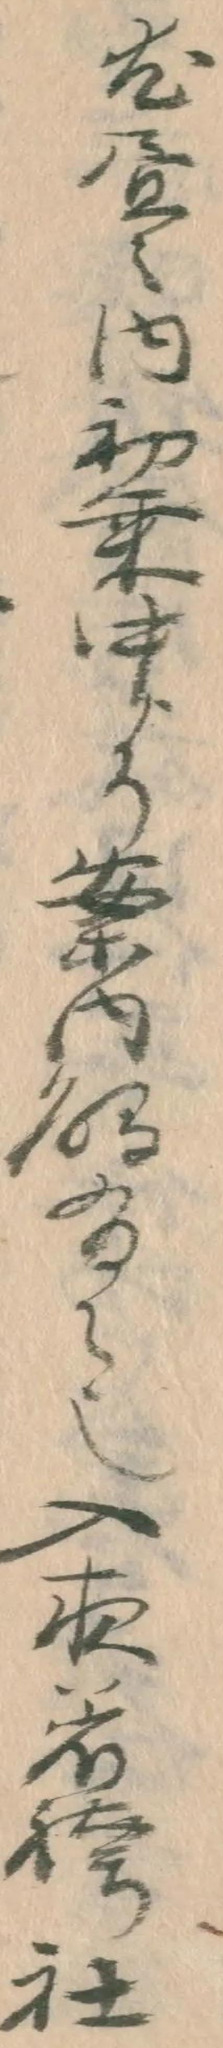尤昼之内初乗中より案内触有之候也入夜着袴社
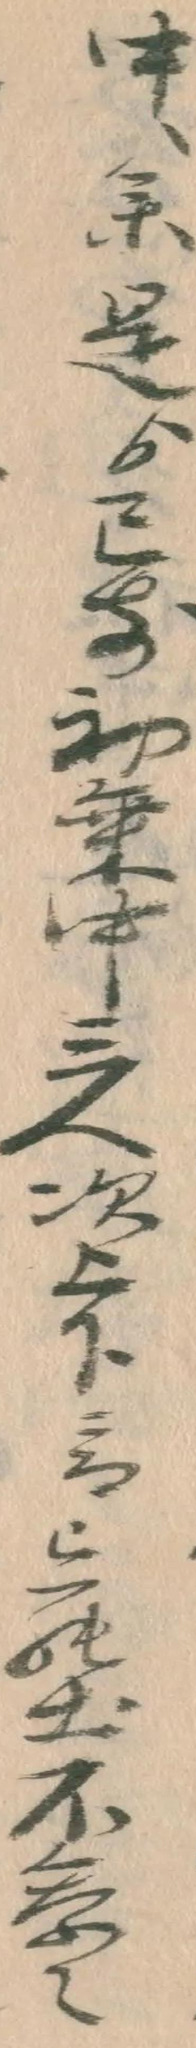中へ参是ゟ已前初乗中三人次上下に而被罷出不参之
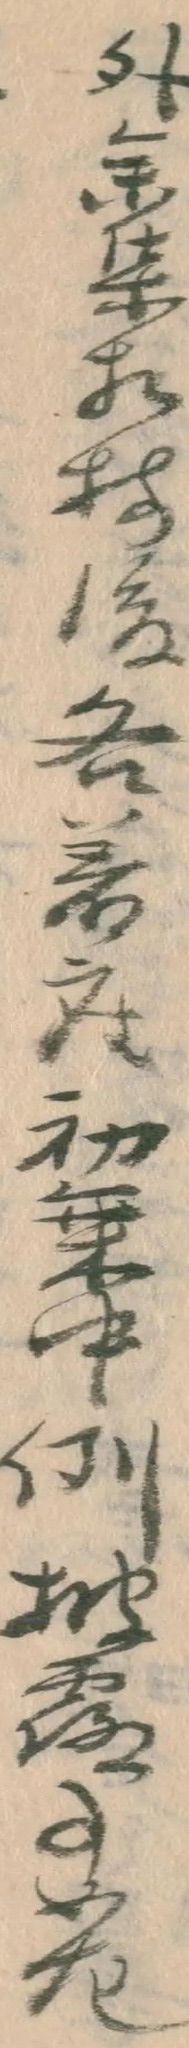外参集相揃後各着座初乗中例披露事如左
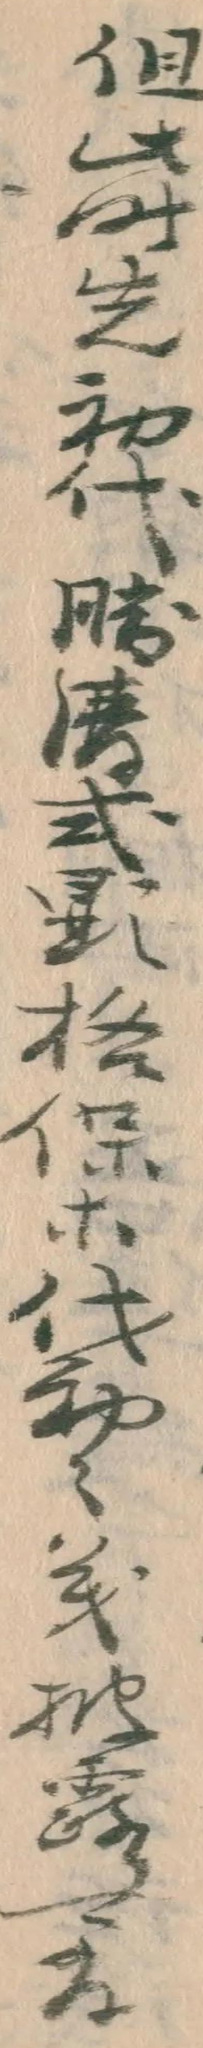但此時先初代勝清式顕格保等代勤之義披露可有
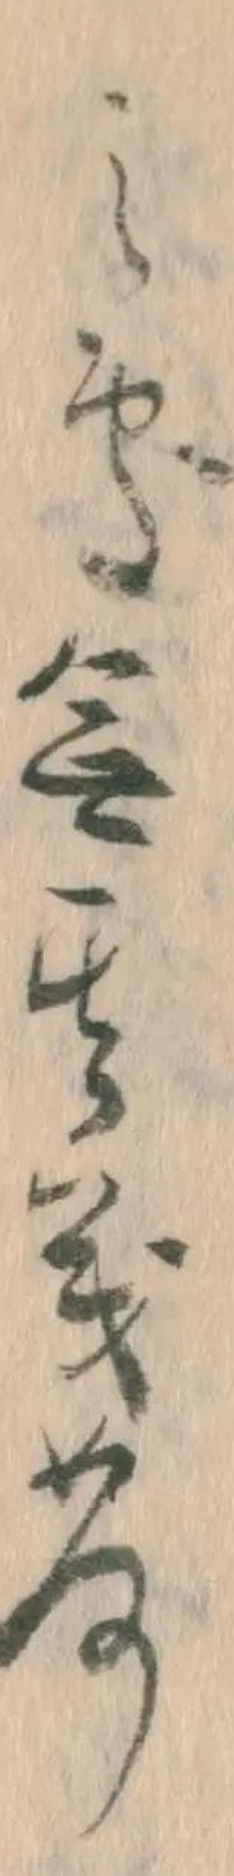之處無其義如何
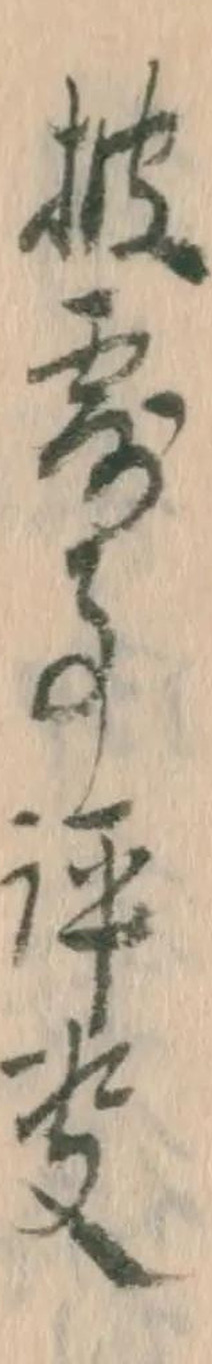披露事評決
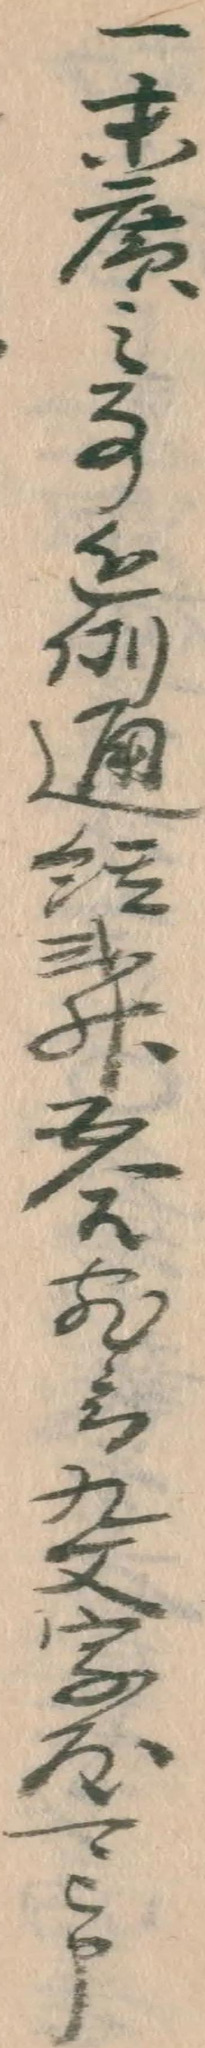一末廣之事近例通経弐升五合前ニ而九文字屋可被申
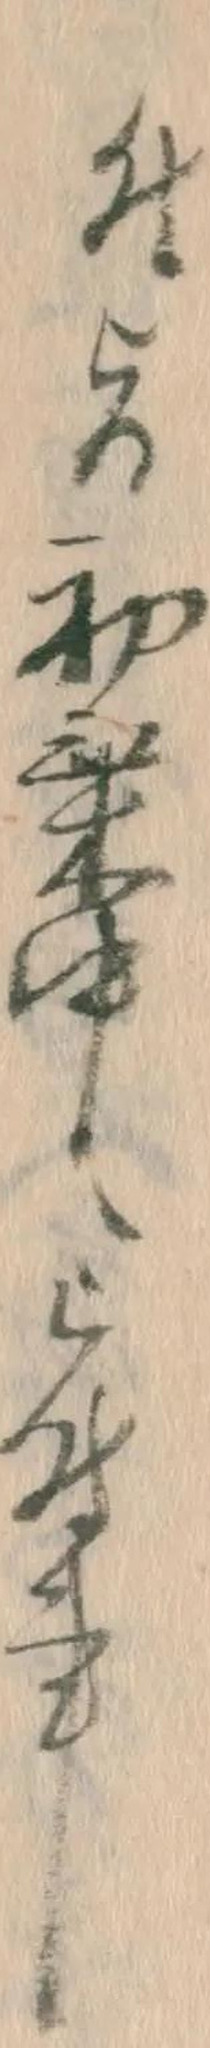付旨初め来中へ被付事
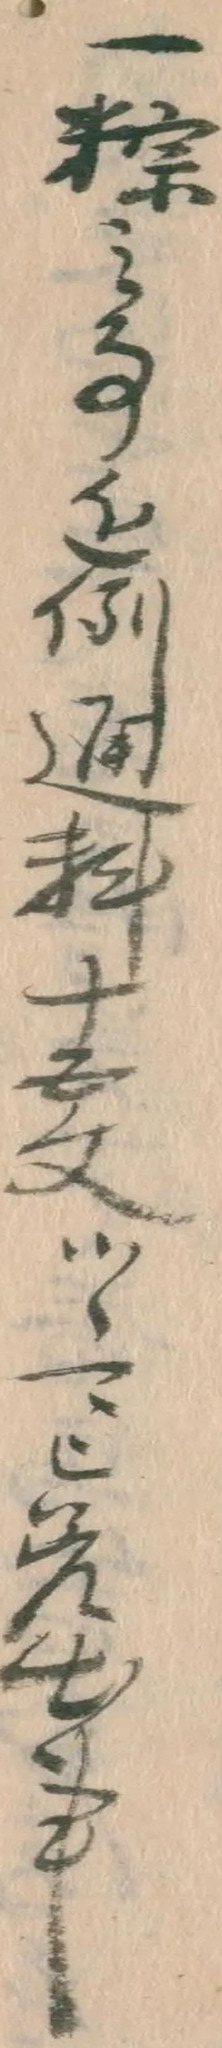一粽之事近例通料十五文ツヽ可被差出事
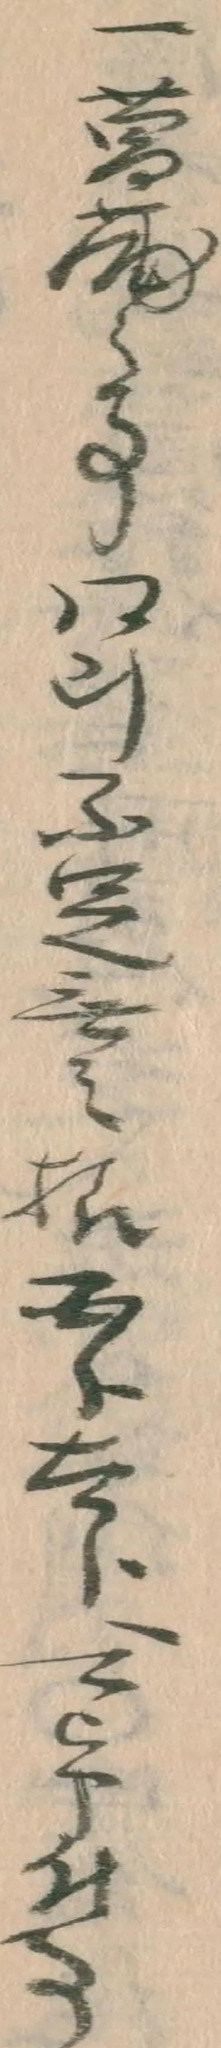一菖蒲之事同断不足無之様五郎太郎へ可被申付事
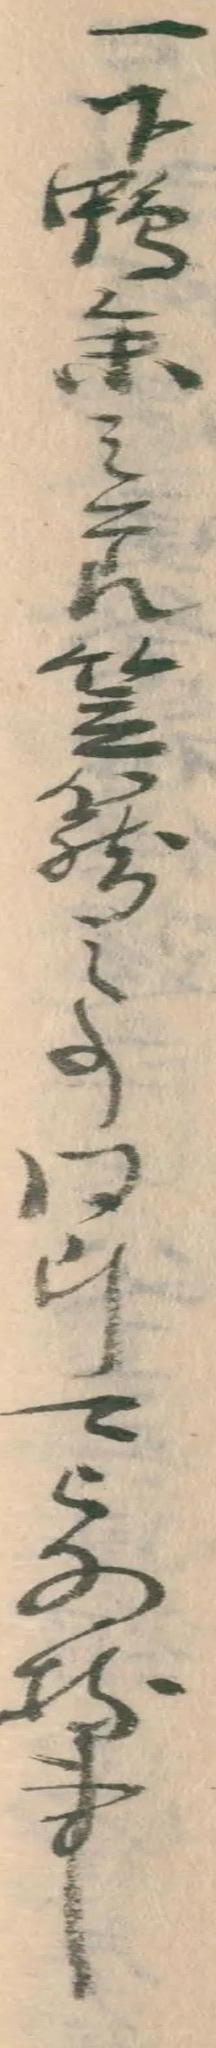一下鴨参之節笠籠之事同断可被為持事
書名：賀茂社記録. 第63冊
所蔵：国立国会図書館 National Diet Library, JAPAN
